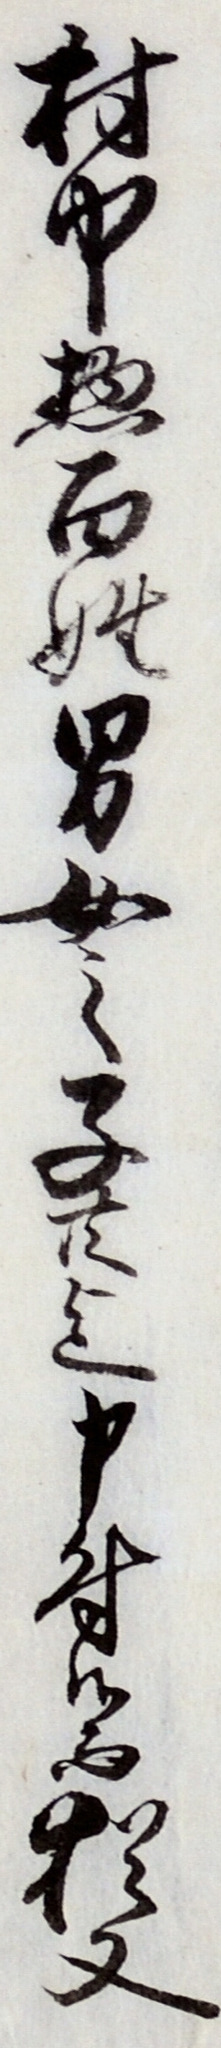村中惣百姓男女之子共迄申付候而猶又
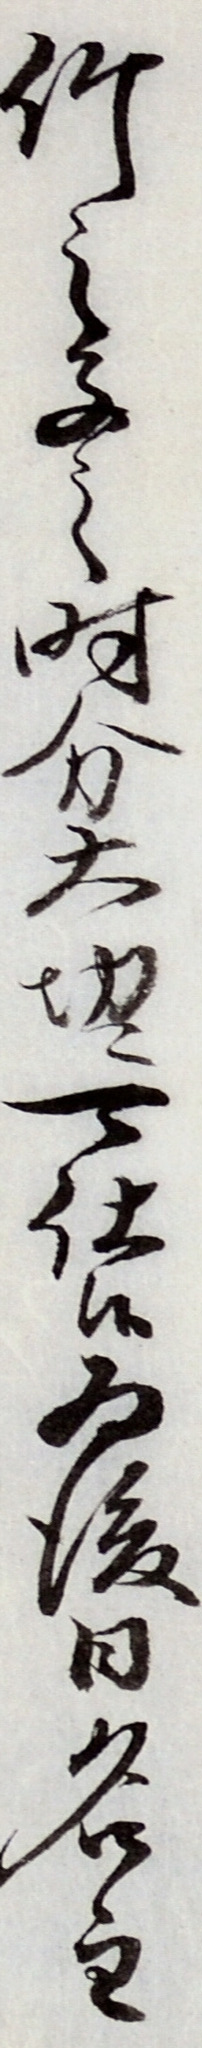竹之子之時分大切ニ可仕候為後日名主
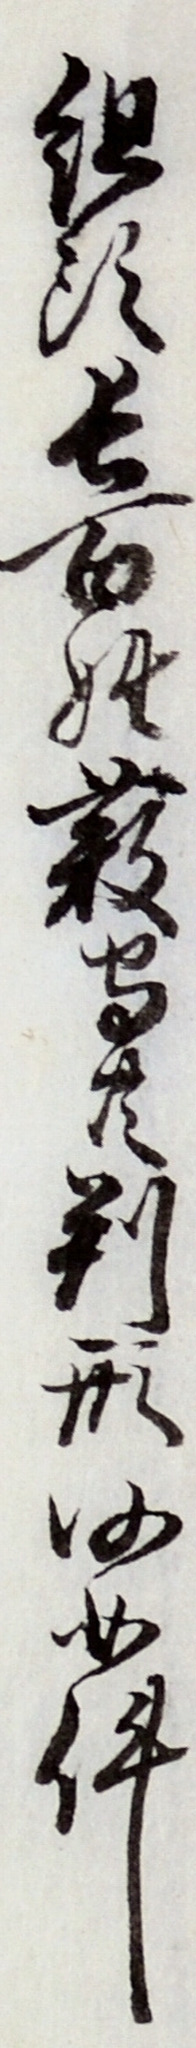組頭長百姓薮守共判形仍如件
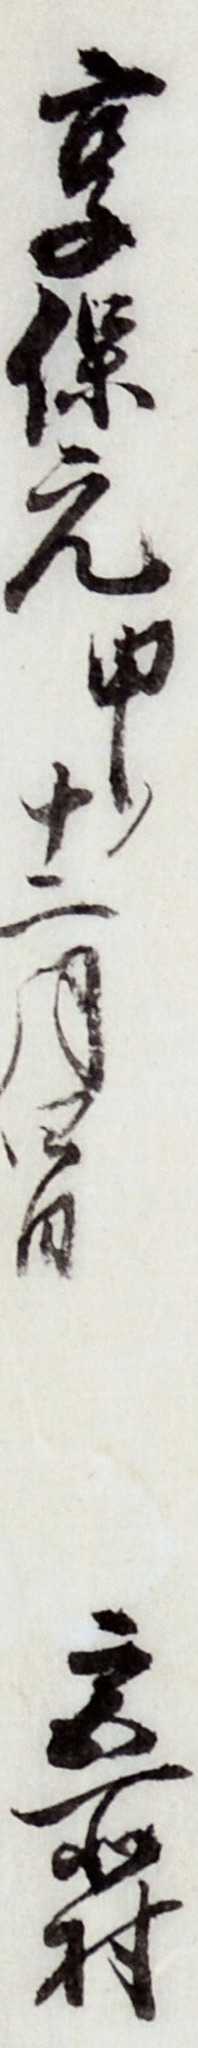享保元申ノ十二月四日宮所村

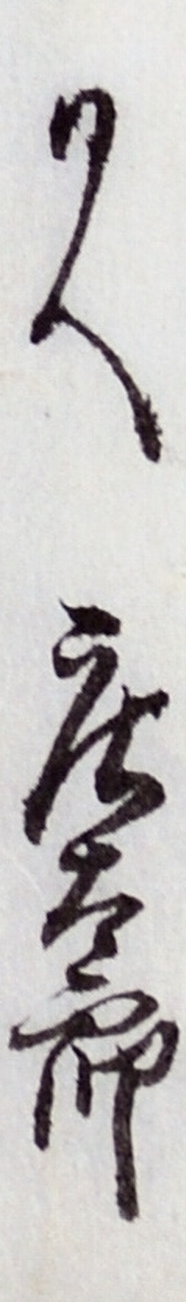同人庄太郎
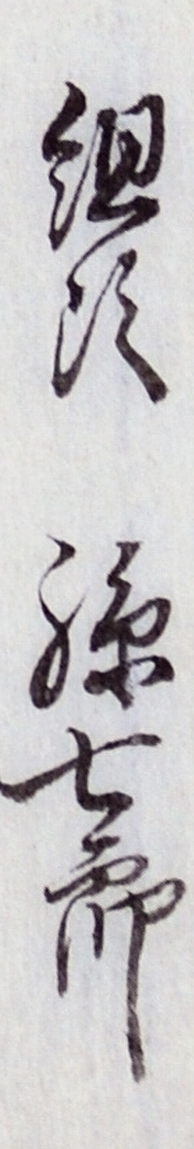組頭孫七郎
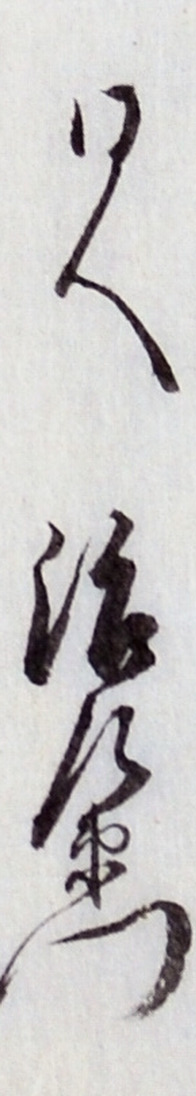同人治左衛門
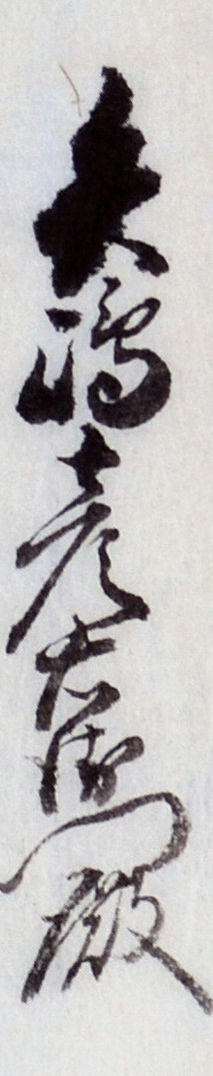矢嶋彦右衛門殿
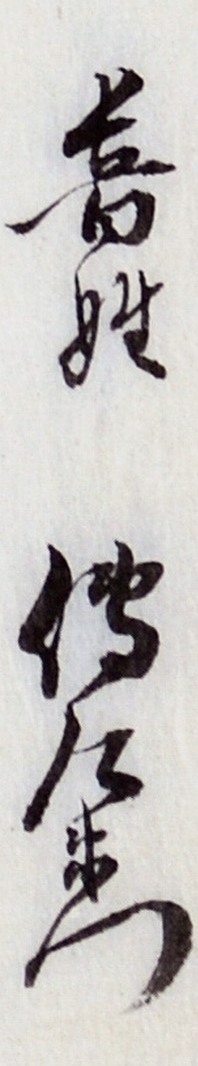長百姓伝左衛門
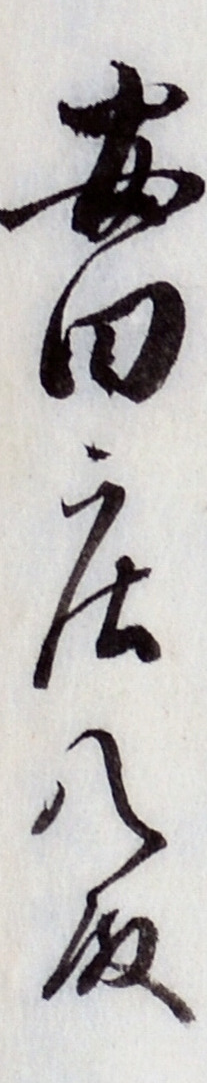安田庄八殿
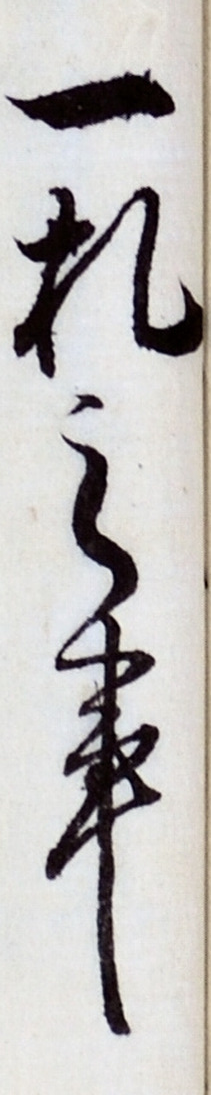一札之事
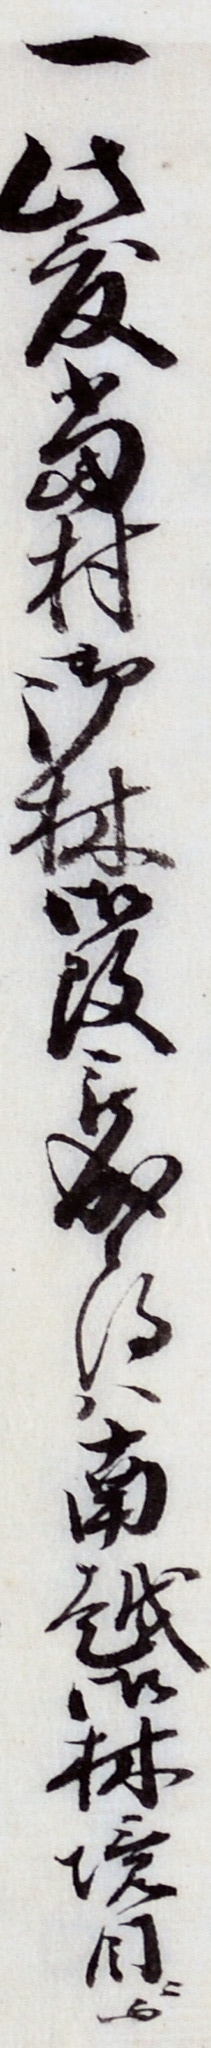一此度当村御林御改被成候得ハ南越御林境目ニ而
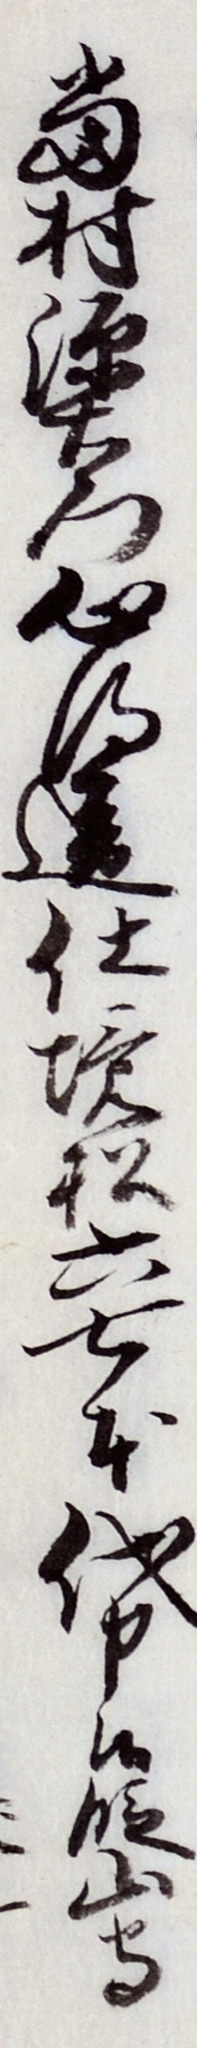当村源右衛門心得違仕境松六七本伐申候段山守
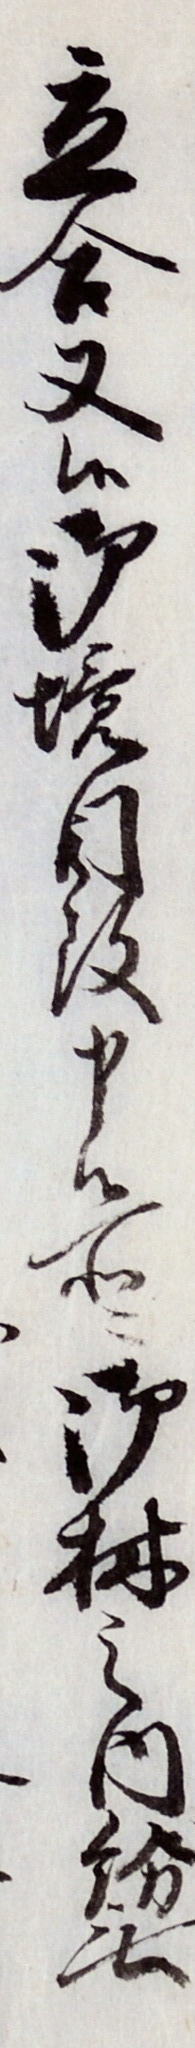立合又候御境目改申候所ニ御林之内ニ紛無
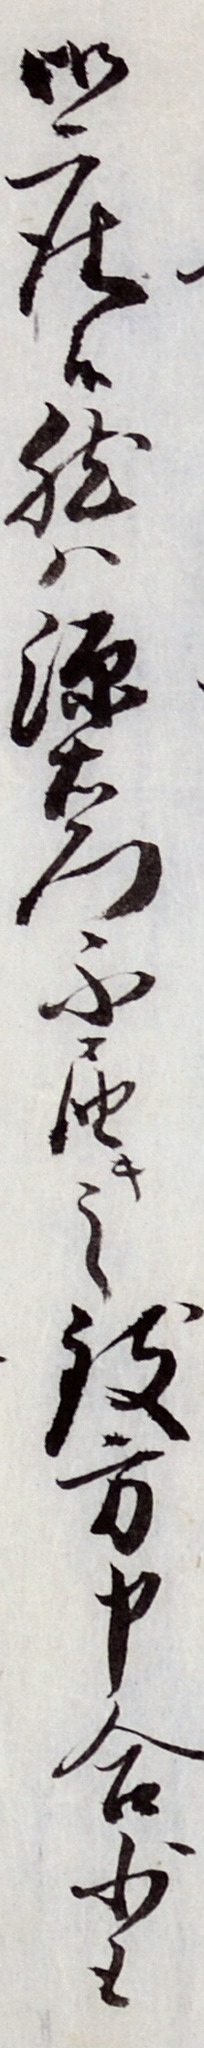御座候然ハ源右衛門不届キ之致方申合少も
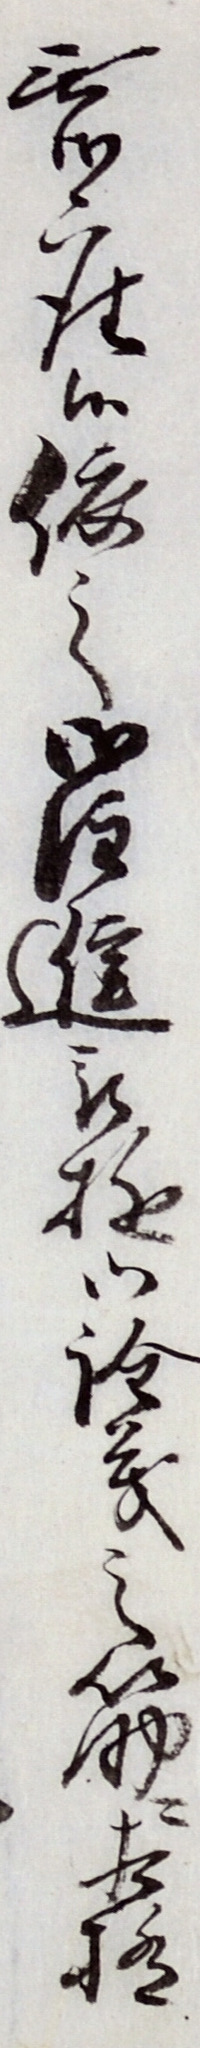無御座候依之御注進被遊御詮義之筋ニ相極
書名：御林御竹藪証文控
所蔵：伊那市立高遠町図書館・合同会社AMANE
